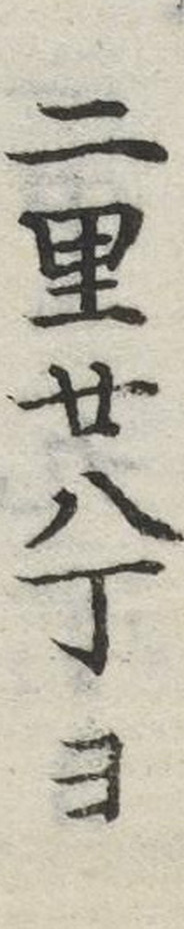二里廿八丁ヨ
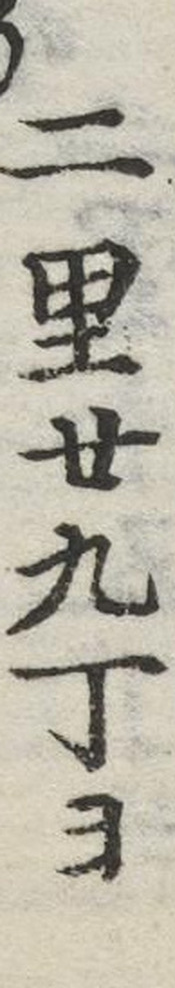二里廿九丁ヨ
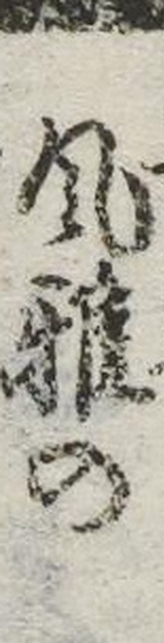風雅の
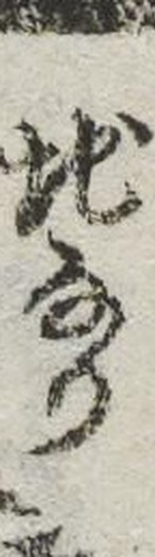地なり
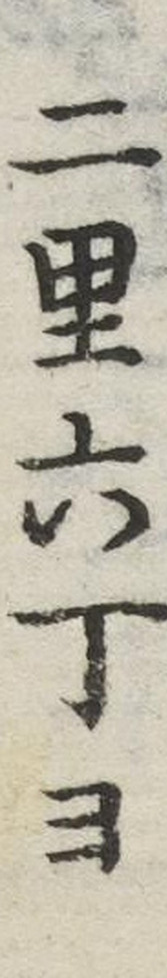二里六丁ヨ
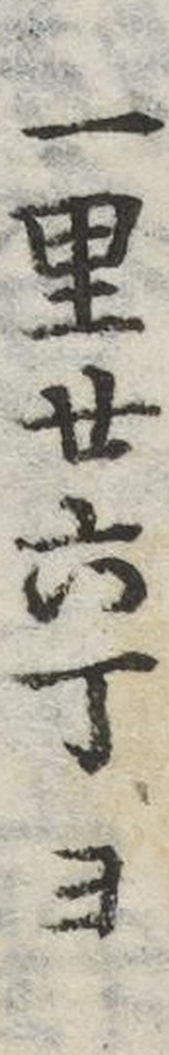一里廿六丁ヨ
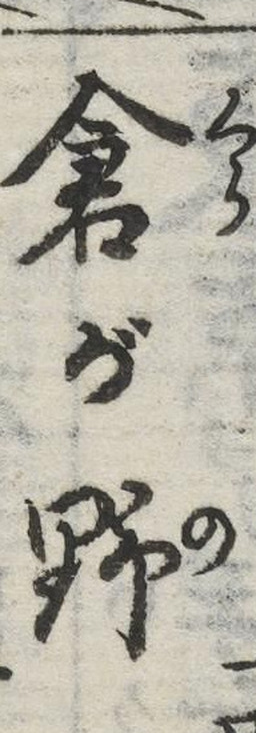倉が野
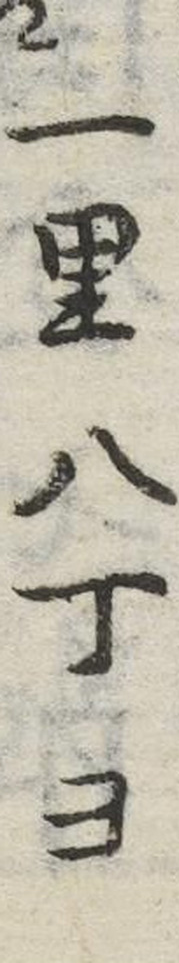一里八丁ヨ
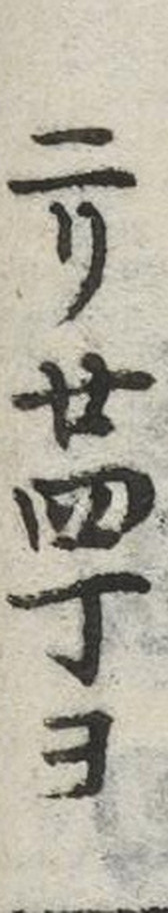二里廿八丁ヨ
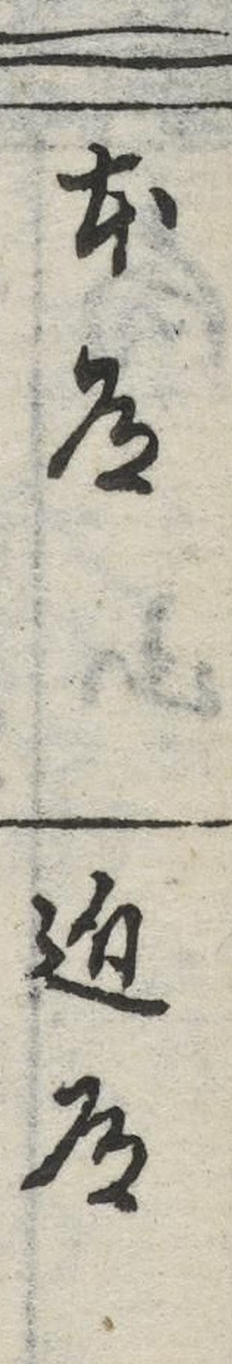本道近道
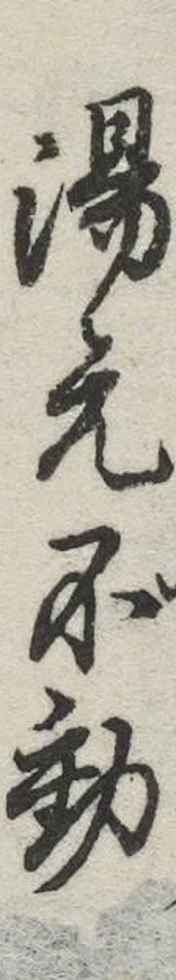湯元不動
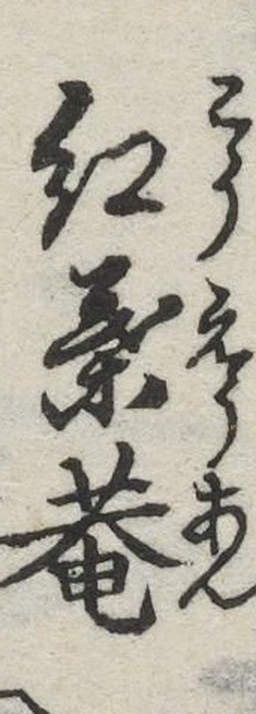紅葉庵
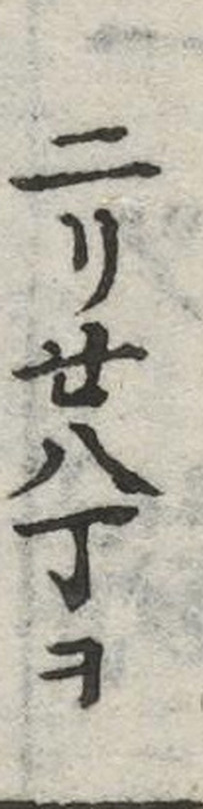二里廿八丁ヨ
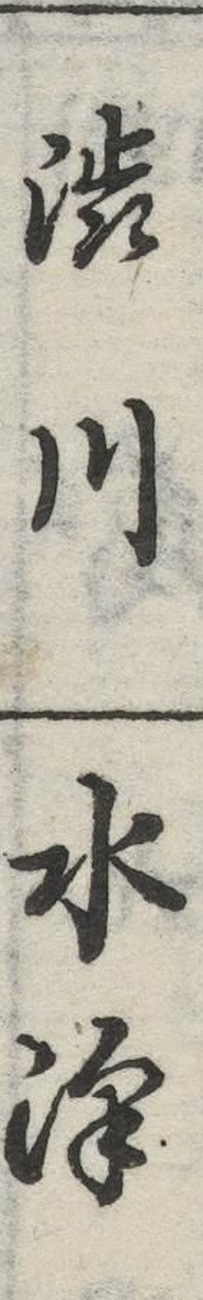渋川水澤
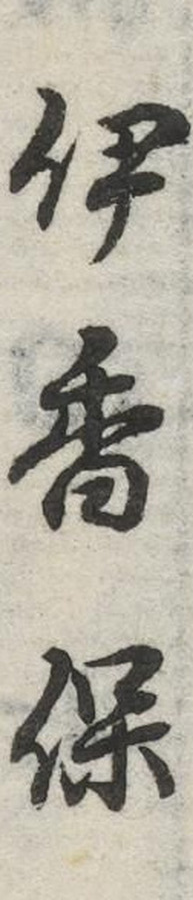伊香保
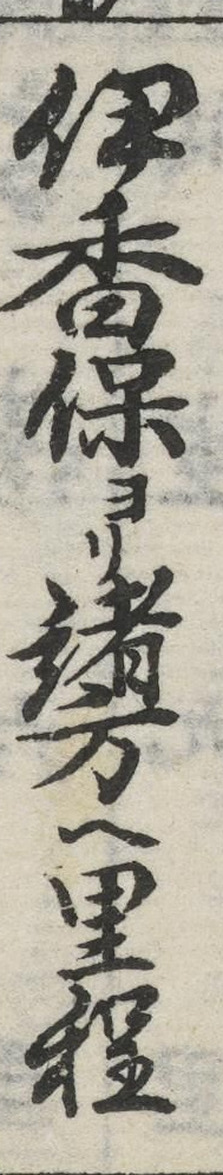伊香保ヨリ諸方へ里程
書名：諸國温泉遊覽記　全
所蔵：東京大学地震研究所図書室 Earthquake Research Institute Library, The University of Tokyo, JAPAN
